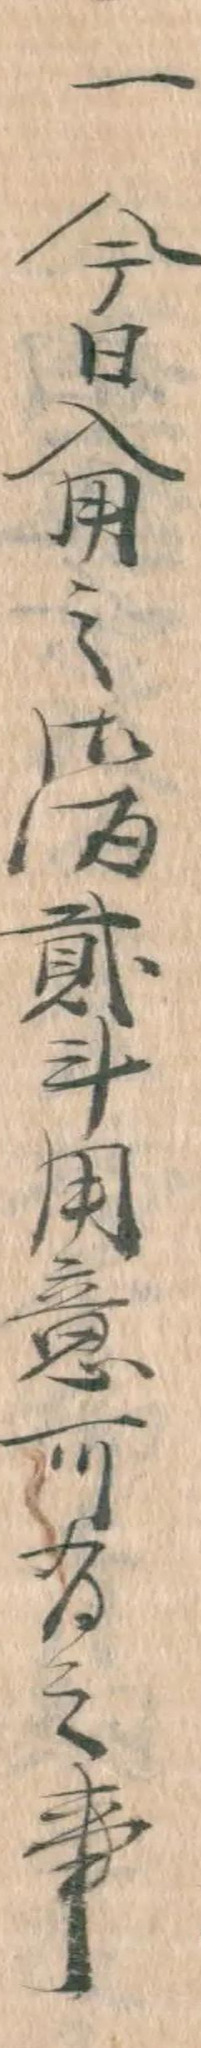一今日入用之御酒貳斗用意可有之事
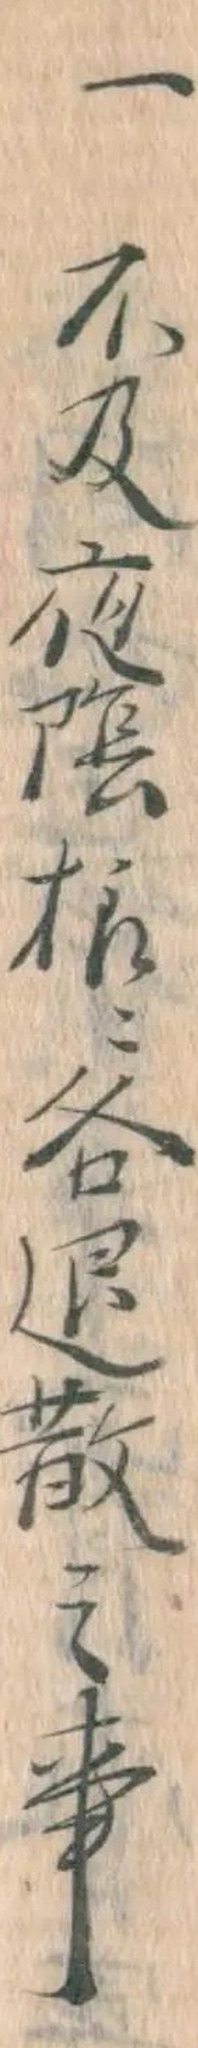一不及夜陰様ニ各退散之事
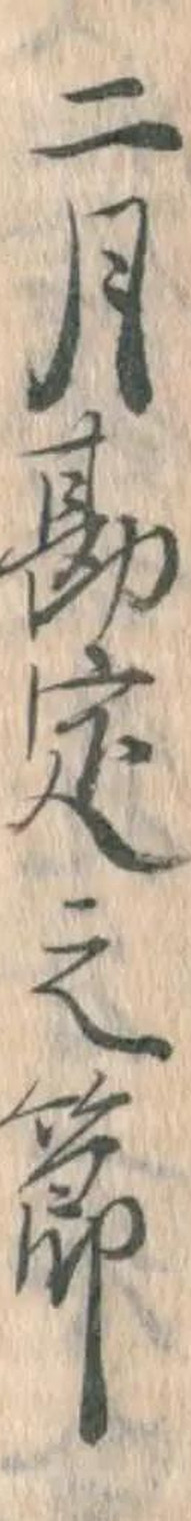二月勘定之節
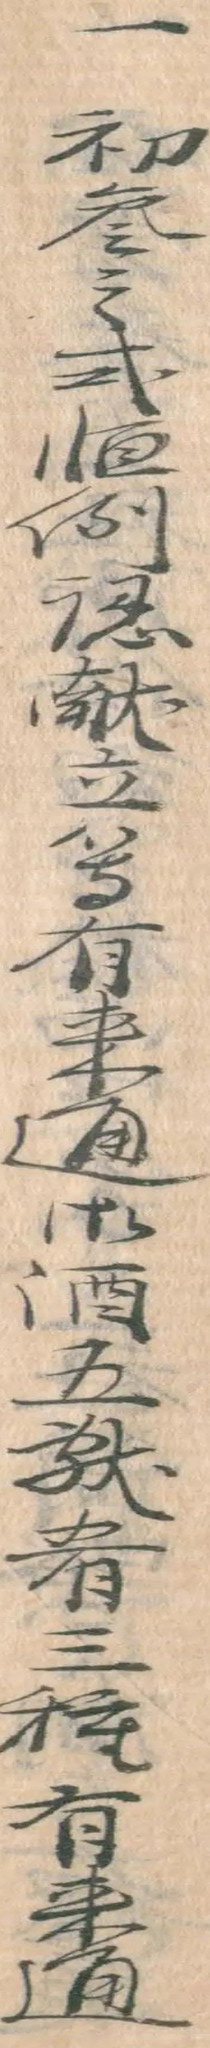一初参之式恒例認献立等有来通御酒五献肴三種有来通
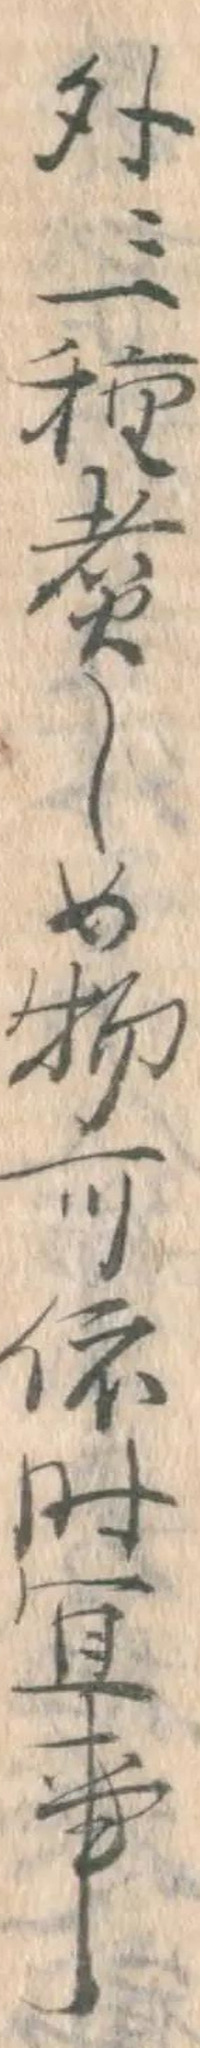外ニ一種煮しめ物可依時宜事
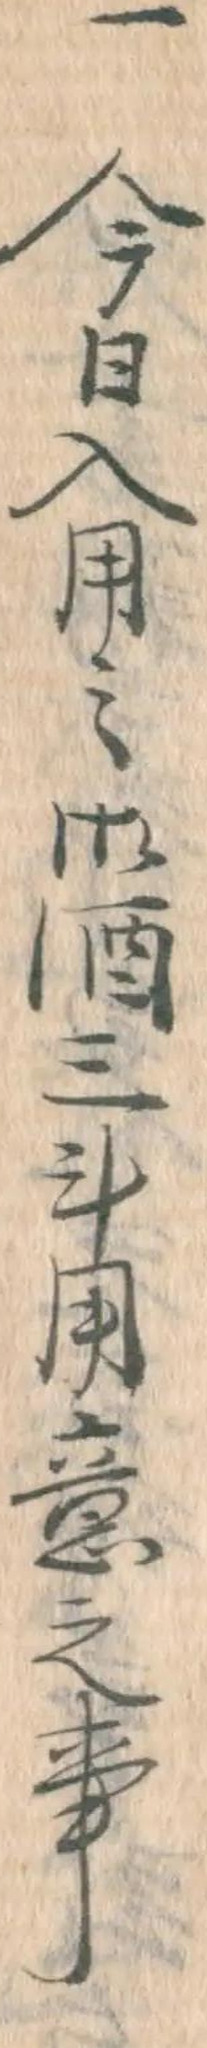一今日入用之御酒三斗用意之事
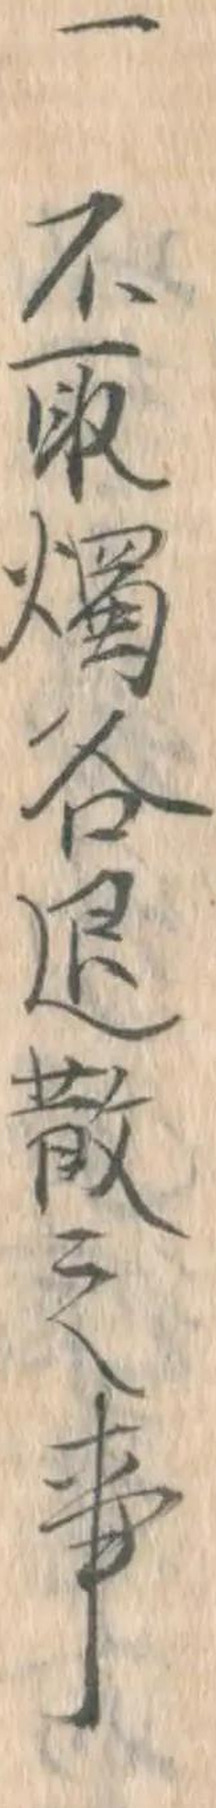一不取燭各退散之事
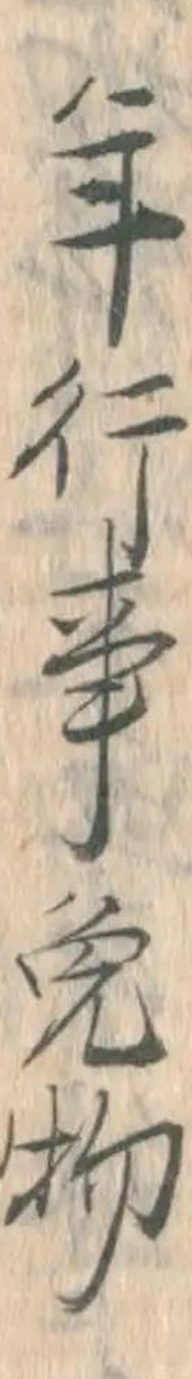年行事免物

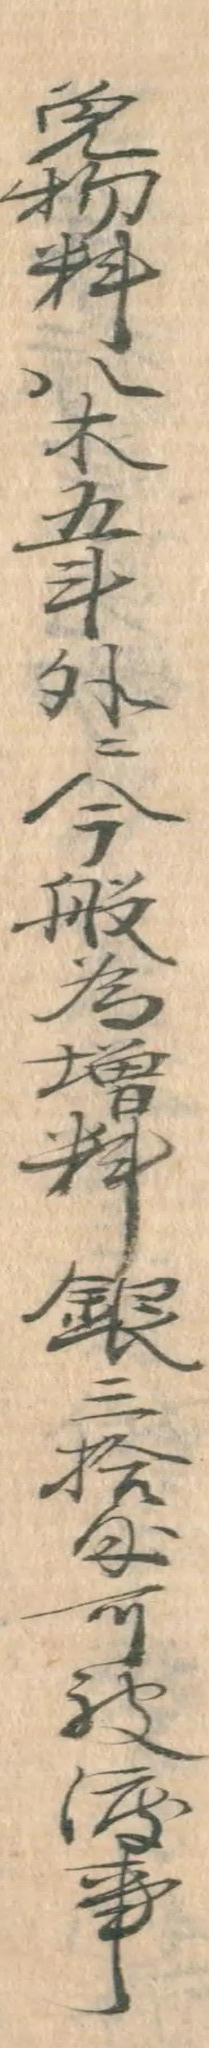一免物料米五斗外ニ今般為増料銀三拾匁可被渡事
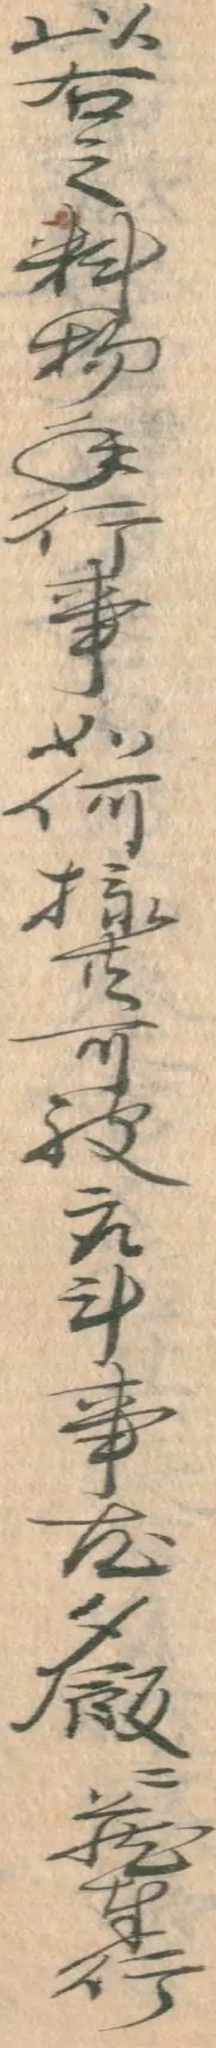以右之料物年行事如何様共可被取斗事尤夕飯ニ蔵奉行
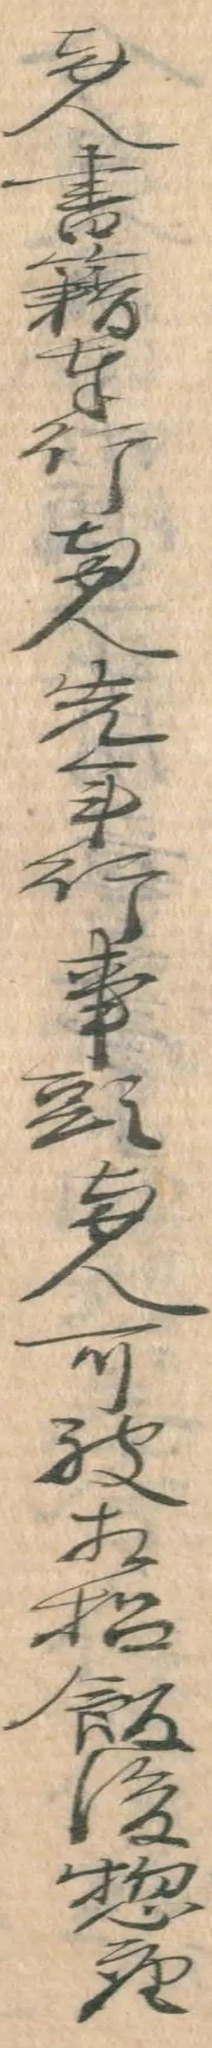両人書籍奉行両人先年行事頭両人可被相招飯後惣座
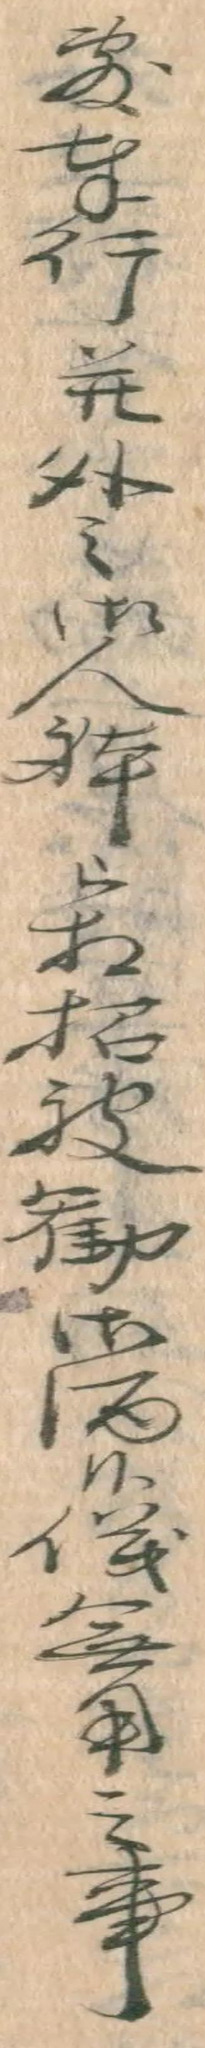敷奉行并外之御人躰被相招被勧御酒候儀無用之事
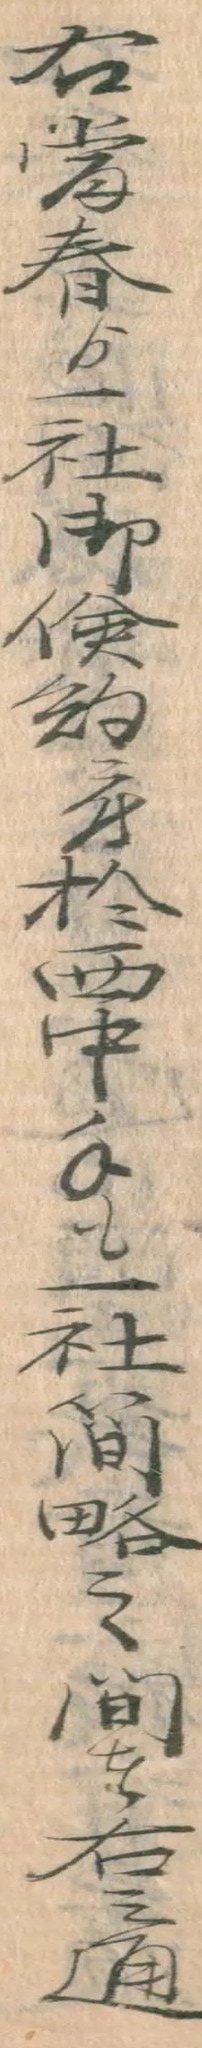右當春ゟ一社御倹約ニ付於西中手も一社簡略之間は右之通
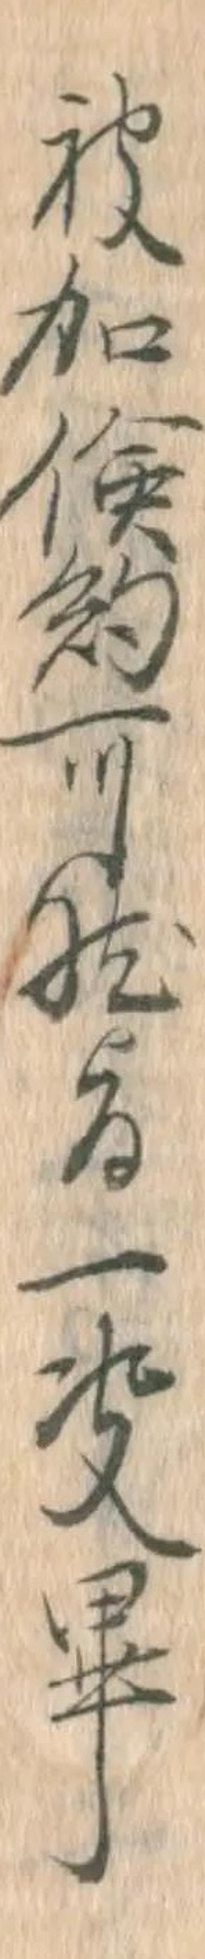被加倹約可然旨一決畢
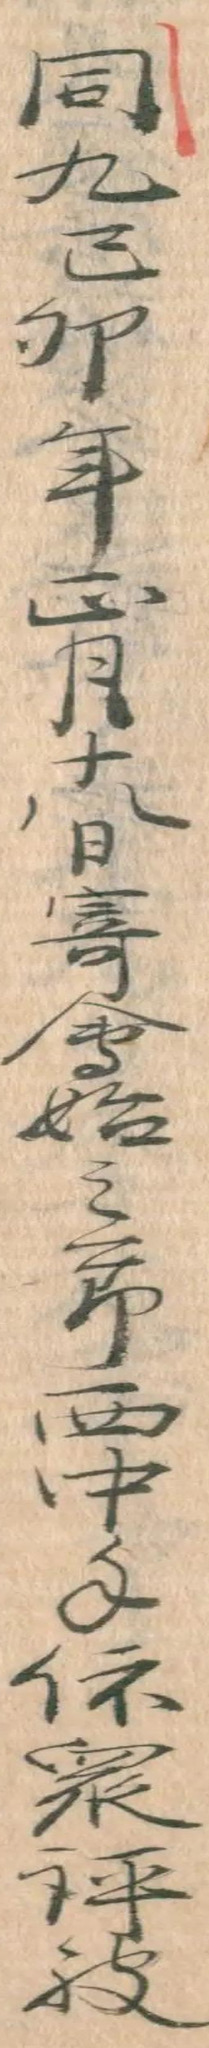同九己卯年正月十八日寄會始之節西中手依衆評致
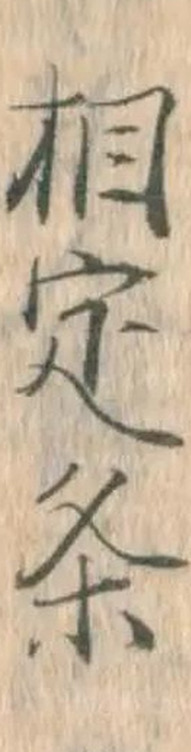相定条
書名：賀茂社記録. 第29冊
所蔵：国立国会図書館 National Diet Library, JAPAN
